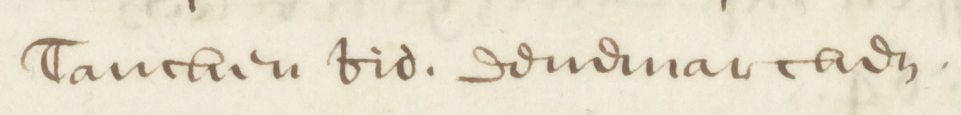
Tancken vid. Denemarcken.
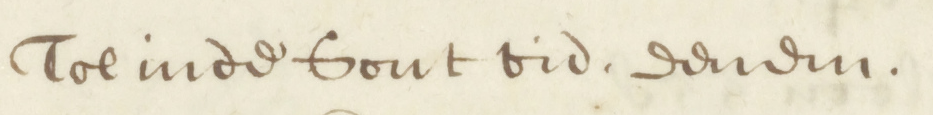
Tol inde Sont vid. Denem.
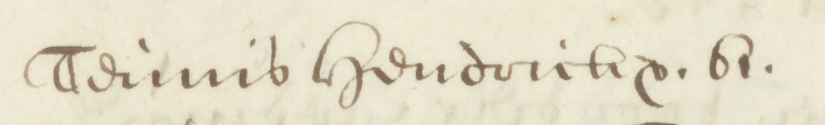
Teunis Hendrickx. 61.
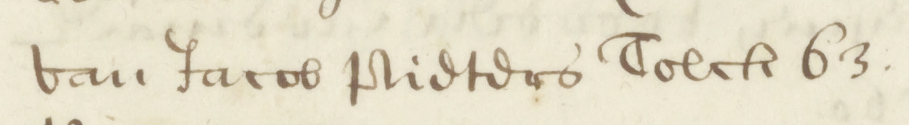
van Jacob Pieters Tolck 63.
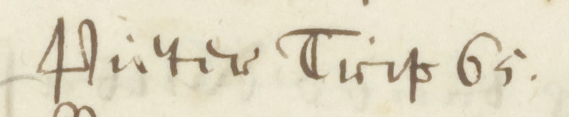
Pieter Trip 65.
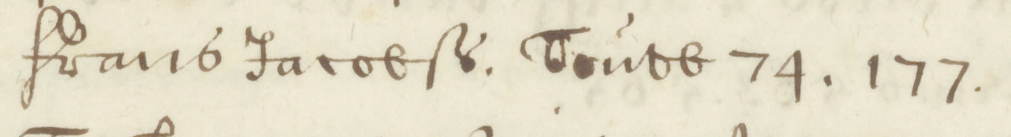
Frans Jacobs. Touw 74. 177.
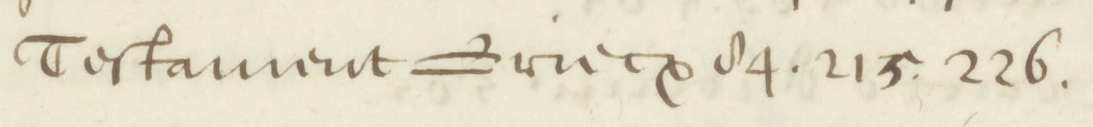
Testament Griecx 84. 215. 226.
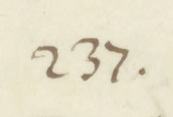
237.
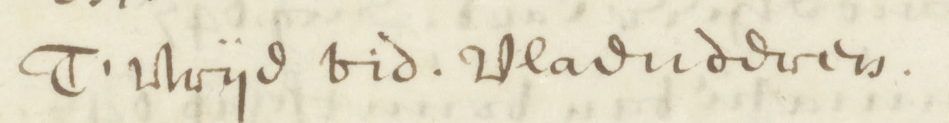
T‛ Vrije vid. Vlaenderen.
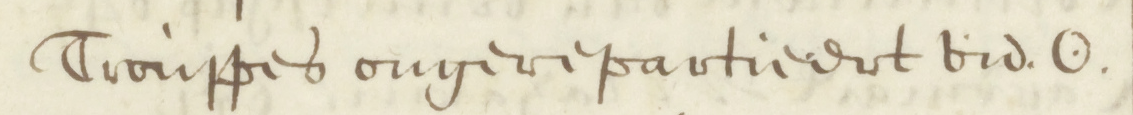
Trouppes ongerepartieert vid. O.
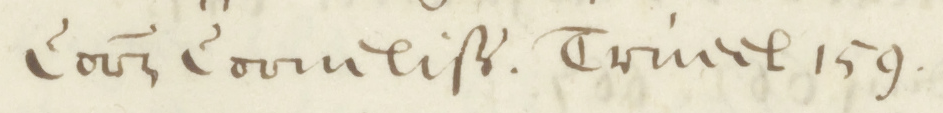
Corn Cornelis. Trueel 159.
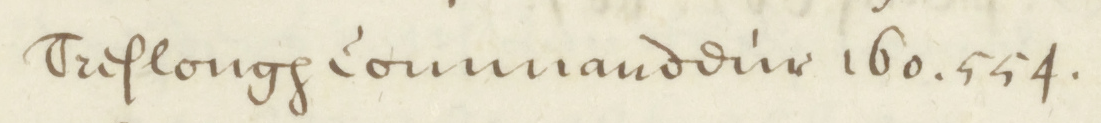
Treslongh Commandeur 160. 554.
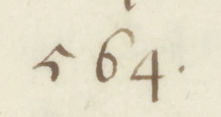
564.
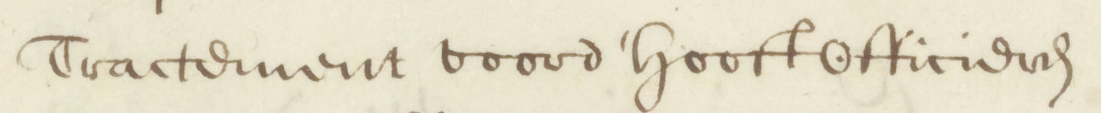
Tractement voord' HooftOfficieren
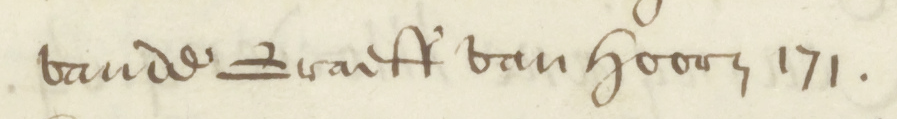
vande Graeff van Hoorn 171.
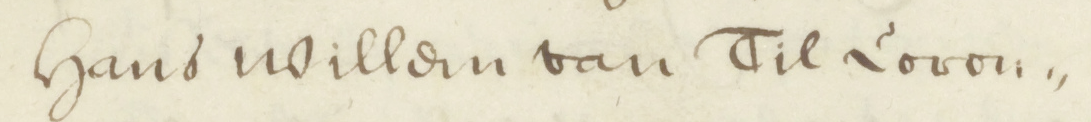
Hans Willem van Til Coron„
